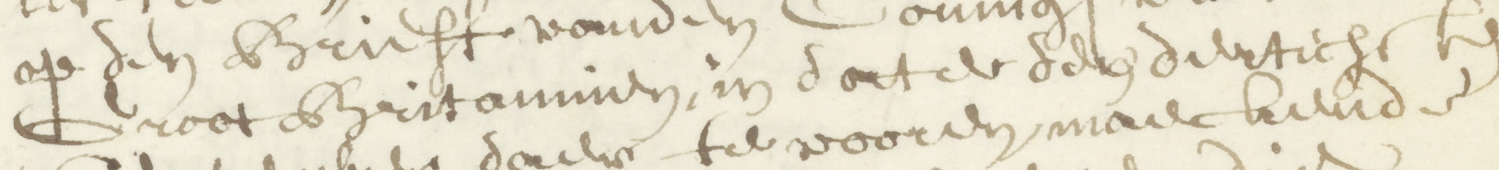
Groot Britannien, in date den dertichsten
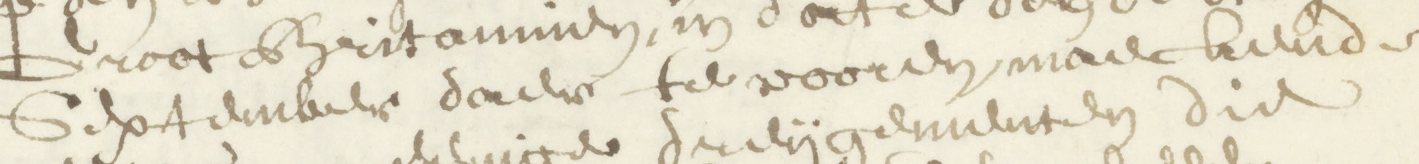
September daer te vooren, maeckende
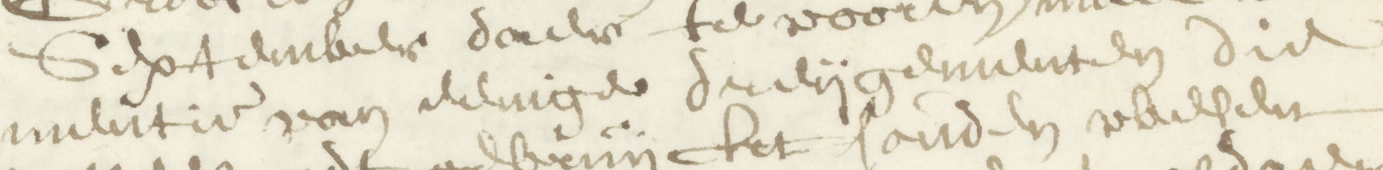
mentie van eenige dreijgementen die
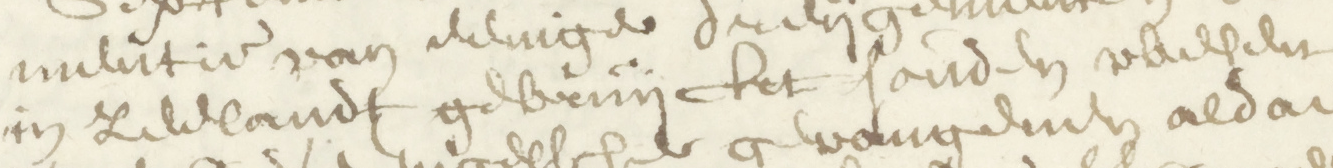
in Zeelandt gebruijckt souden wesen
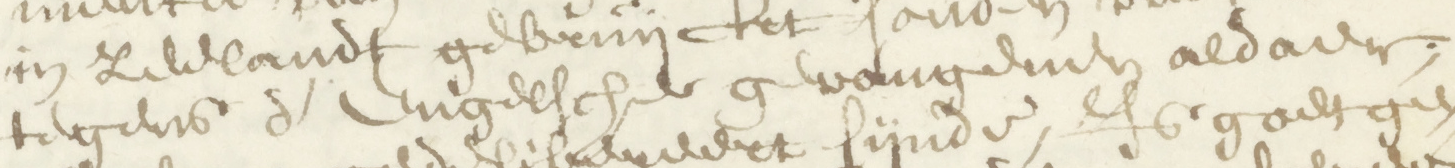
tegens d'Engelsche gevangenen aldaer;
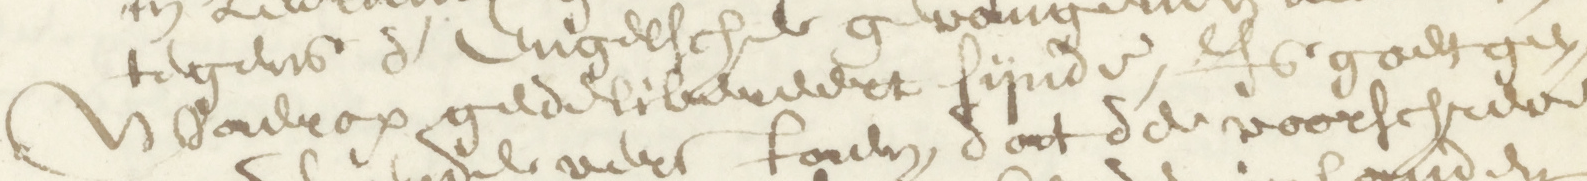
Waerop gedelibereert sijnde, Is goetge„
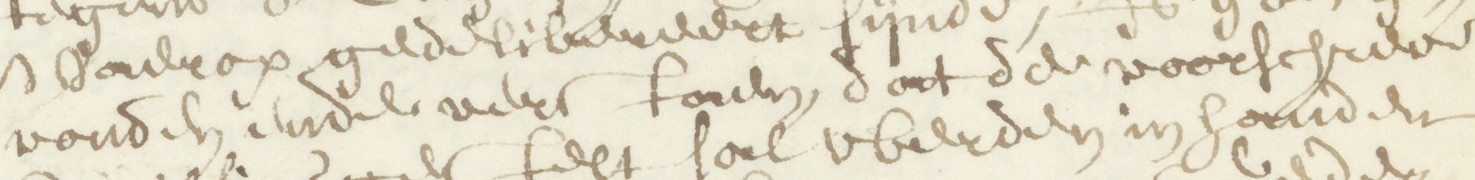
vonden ende verstaen, dat de voorschreve
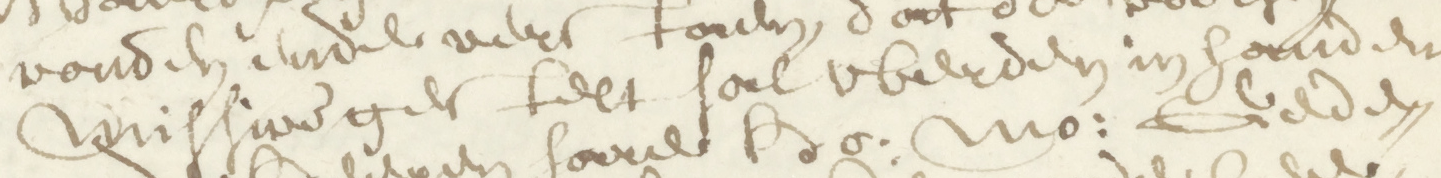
missive gestelt sal werden in handen
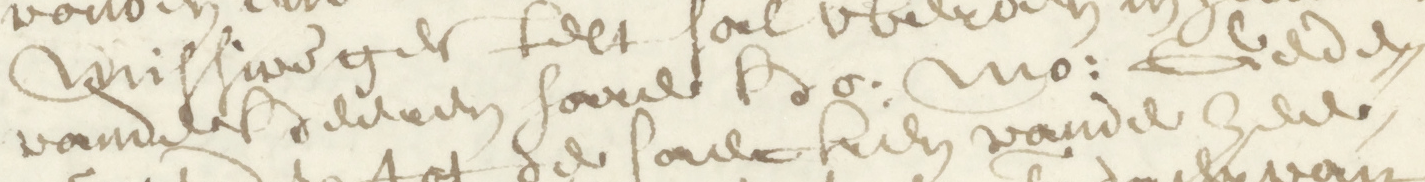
vande Heeren hare Ho:Mo: Gede„,
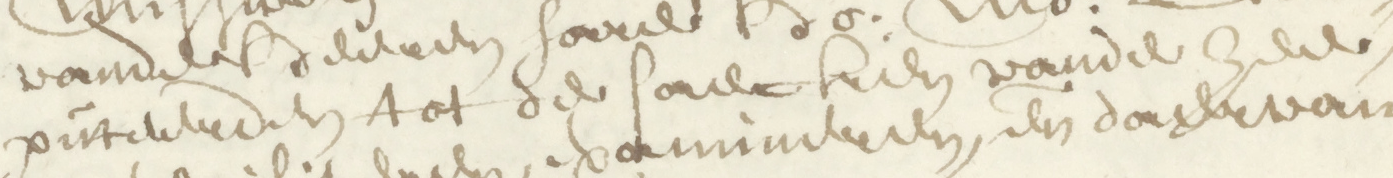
puteerden tot de saecken vande Zee,
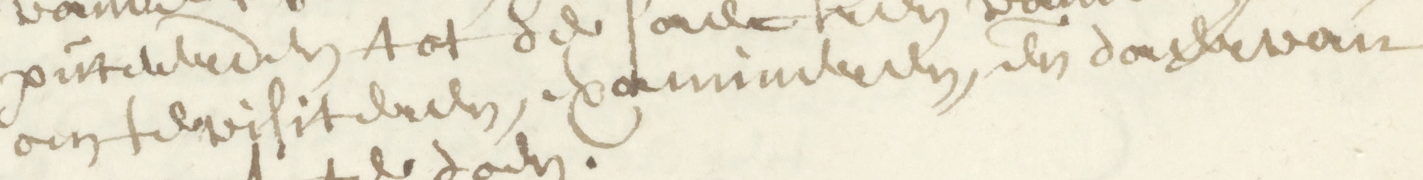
om te visiteren, examineren, en daervan
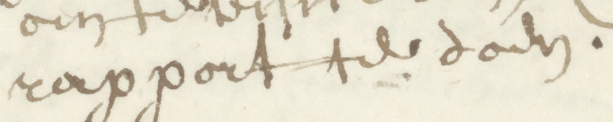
rapport te doen.
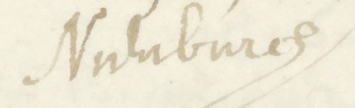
Nieuburch
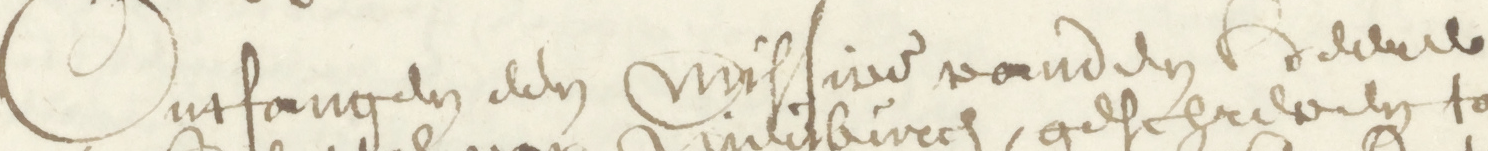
Ontfangen een Missive vanden Heere
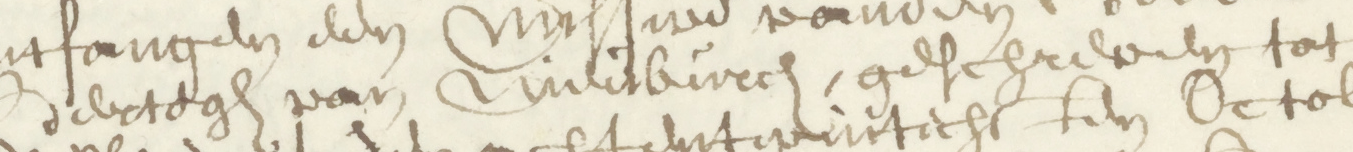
Hertogh van Nieuburch, geschreven tot
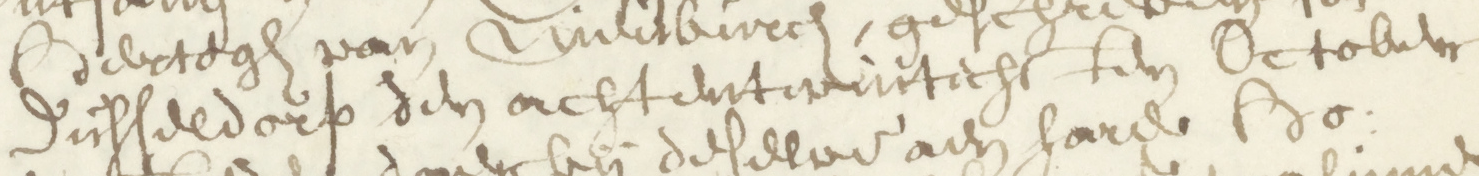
Dusseldorp den achtentwintichsten October
